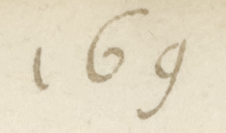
169
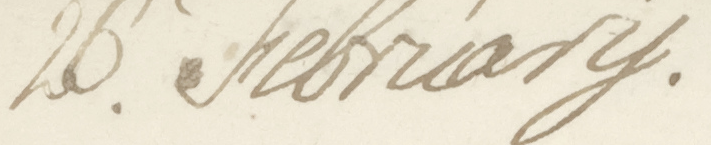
26. Februarij
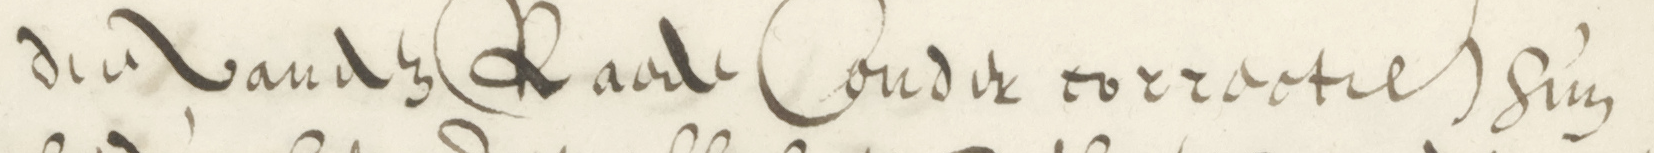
die vanden Raede Onder correctie hun
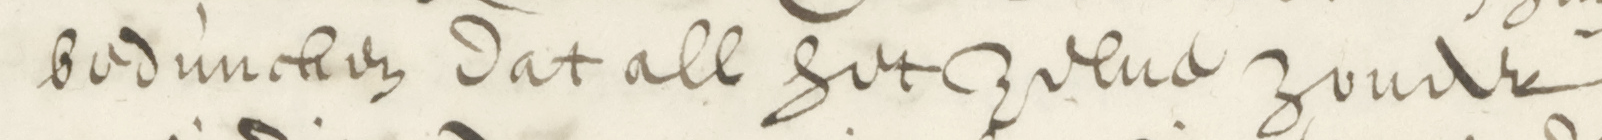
beduncken dat all het zelue zonder
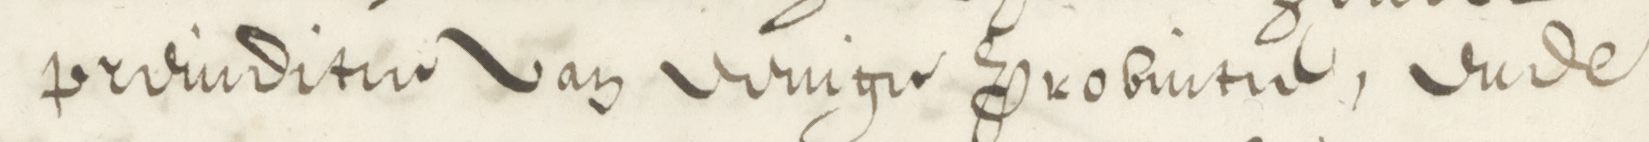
preiuditie van eenige provintie, ende
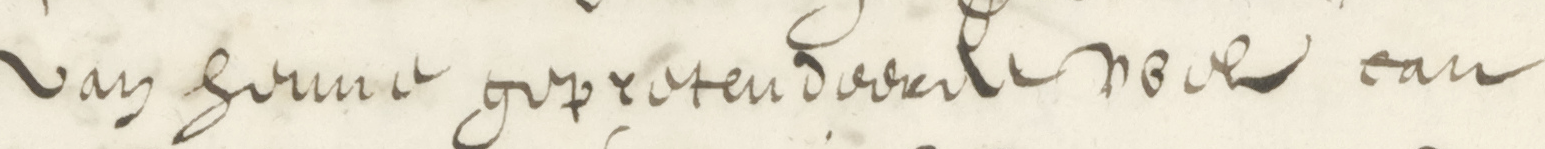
van henne gepretendeerde wel can
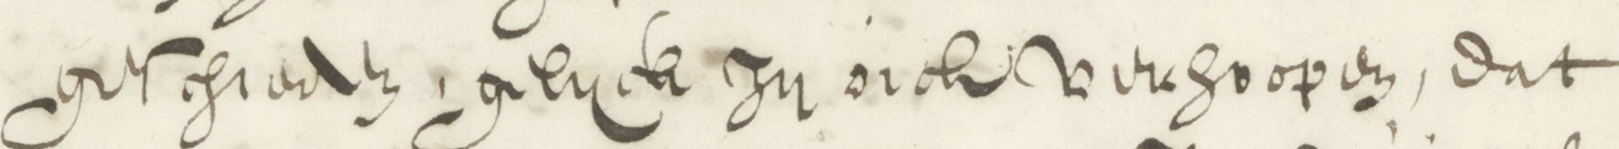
geschieden, gelyck zij oick verhoopen dat
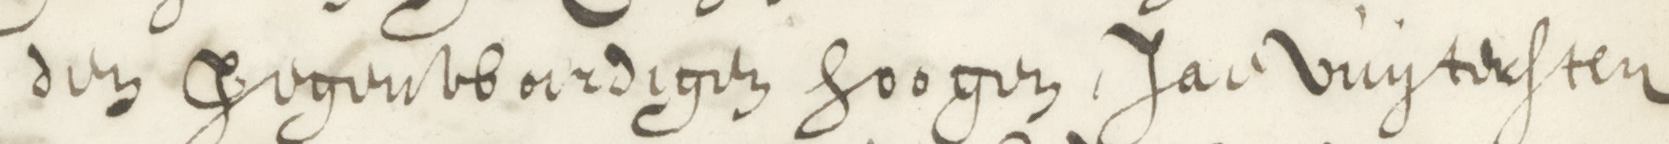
den jegenwoirdigen hoogen, jae vuijtersten
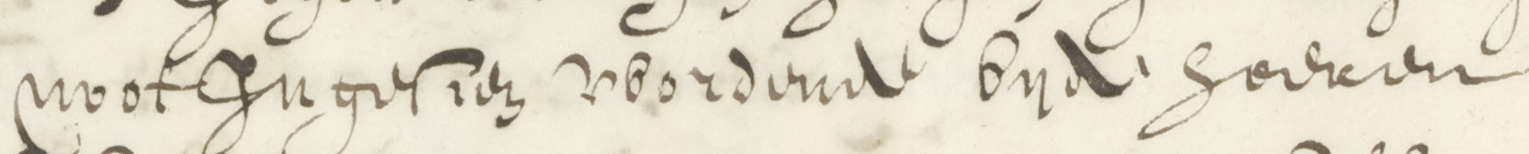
noot ingesien wordende byde heeren
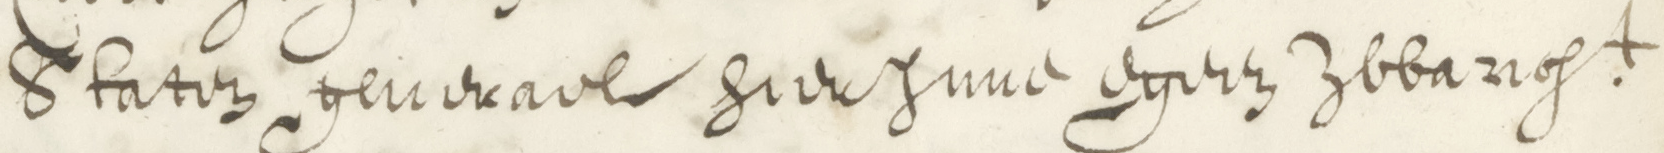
Staten generael hierinne egeen zwaricht
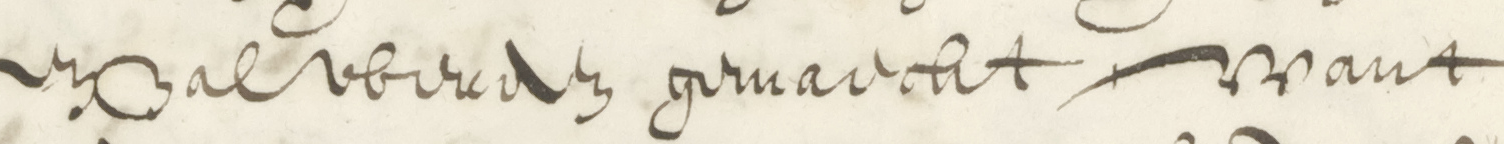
en zal werden gemaeckt want
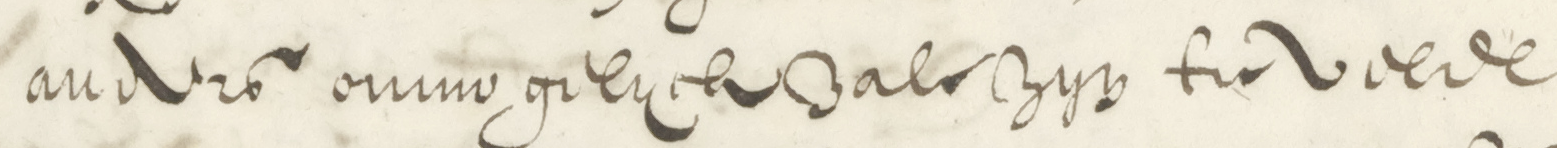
anders onmogelyck zal zijn te velde
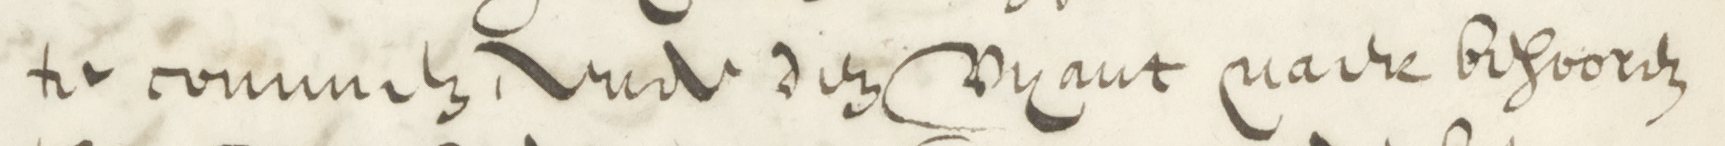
te commen, ende den vyant naer behooren
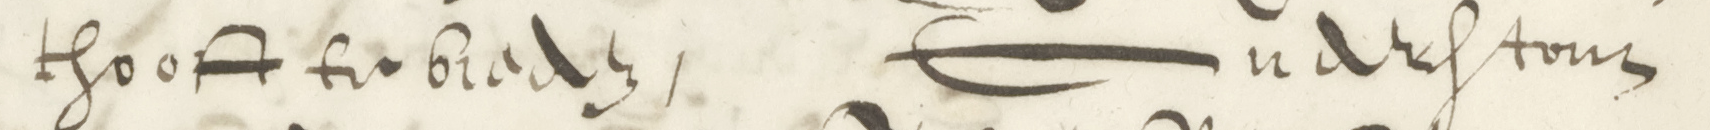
thooft te bieden. Onderstont
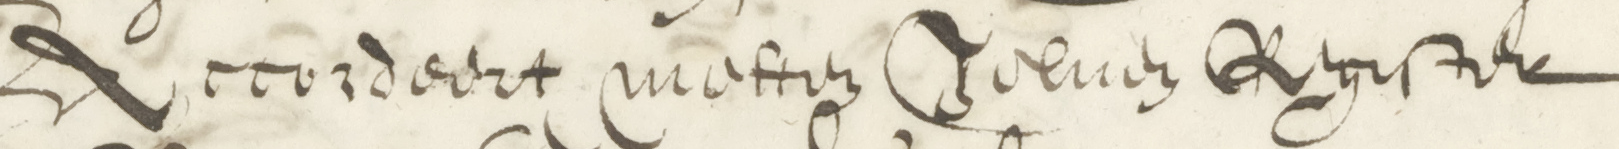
Accordeert metten zeluen Register
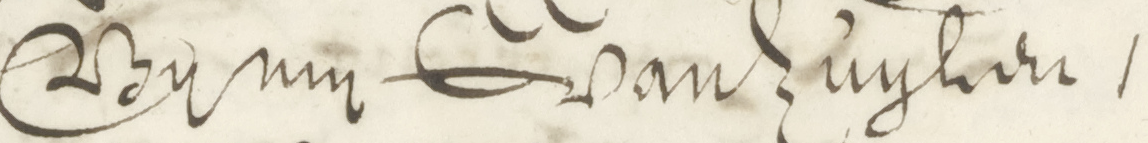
Bij mij Van Zuylen.
